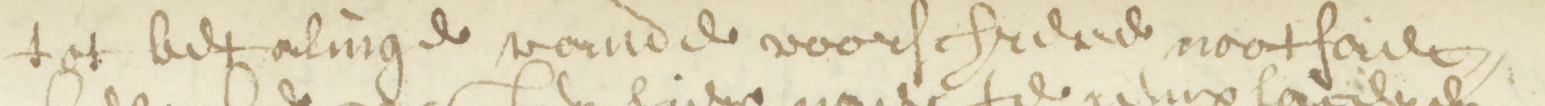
tot betalinge vande voorschreve nootsaec„
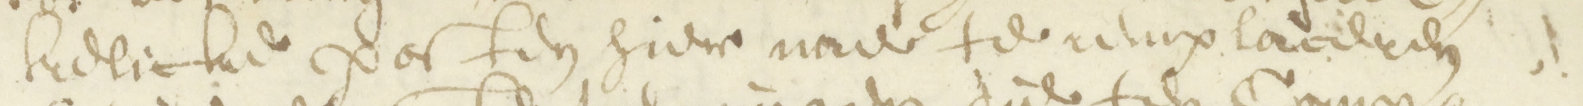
kelicke posten hier nae te remplaceren
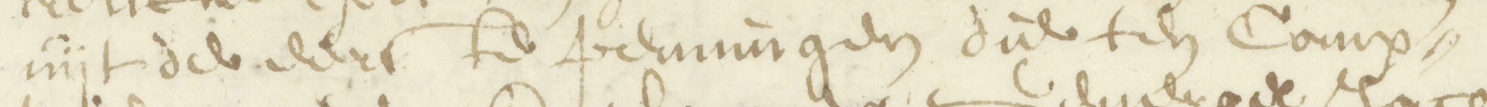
uijt de eerste penningen die ten Comp„
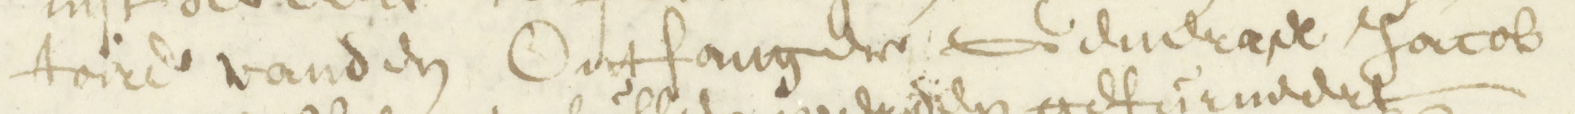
toire vanden Ontfanger Generael Jacob
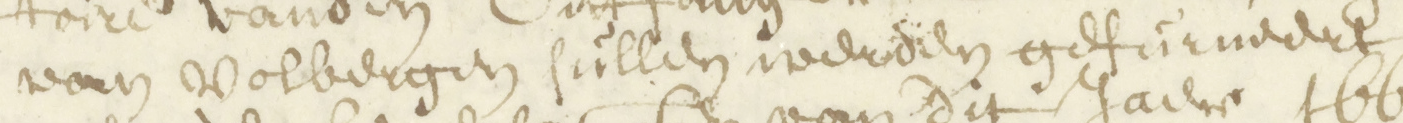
van Volbergen sullen werden gefurneert
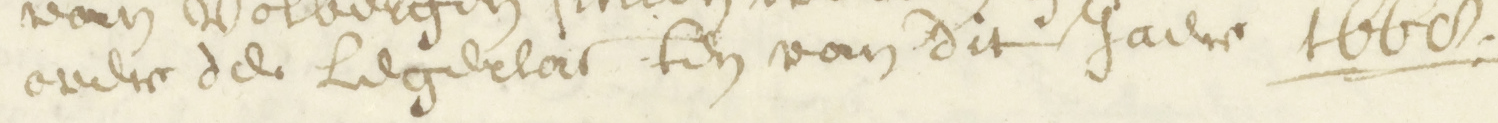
over de Legerlasten van dit Jaer 1668.
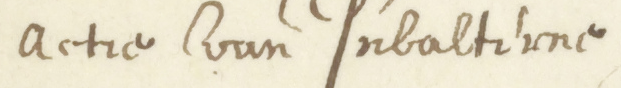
actie van subalterne
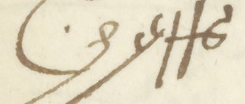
Cheffs
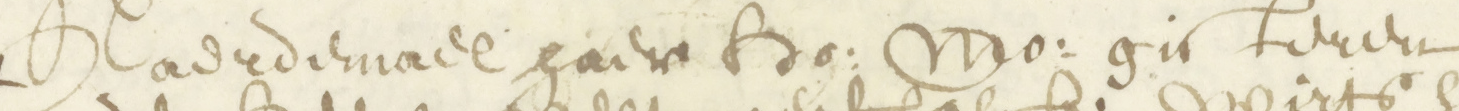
Naerdemael haer Ho:Mo: gisteren
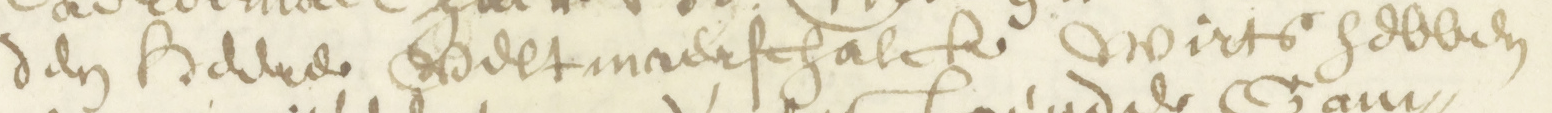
den heere Veltmaerschalck Wirts hebben
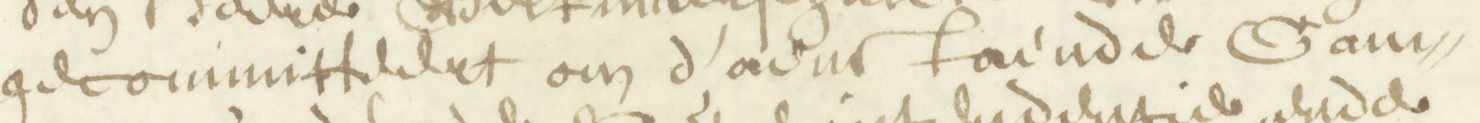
gecommitteert om d'aenstaende Cam,,
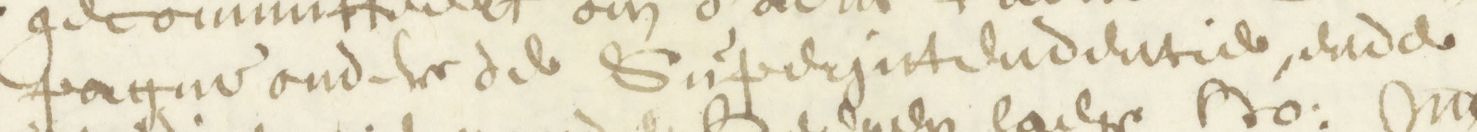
pagne onder de Superintendentie, ende
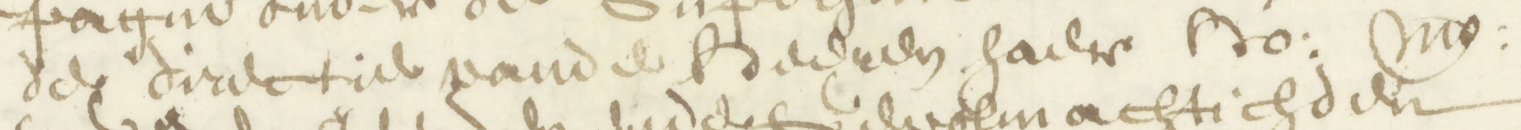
den directie vande Heeren haer Ho:Mo:
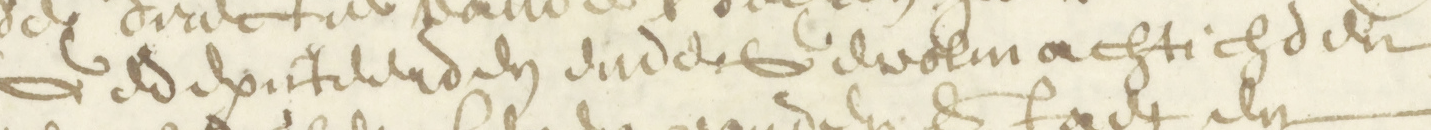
Gedeputeerden ende Gevolmachtichden
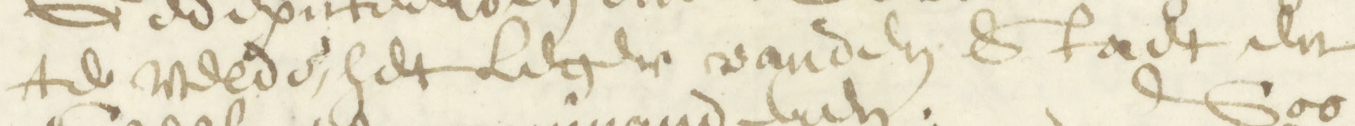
te Velde, het leger vanden Staet en
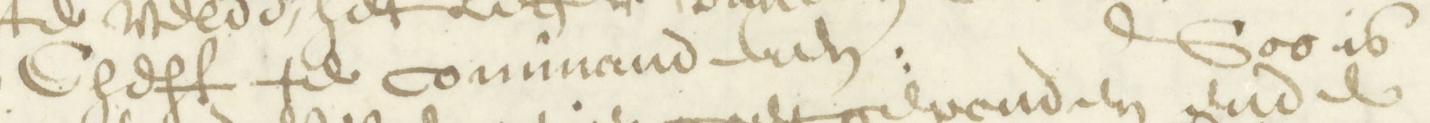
Cheff te commanderen: Soo is
